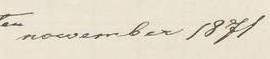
november 1871
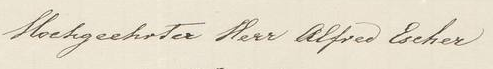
Hochgeehrter Herr Alfred Escher
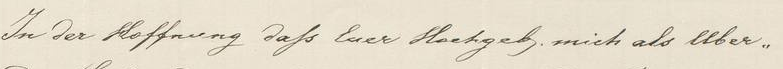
In der Hoffnung dass Euer Hochgeb. mich als Über-
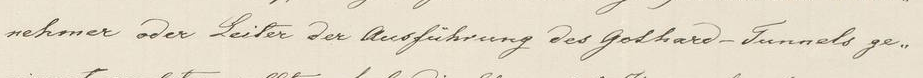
nehmer oder Leiter der Ausführung des Gothard-Tunnels ge-
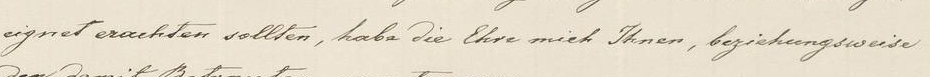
eignet erachten sollten, habe die Ehre mich Ihnen, beziehungsweise
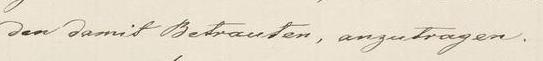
den damit Betrauten, anzutragen.
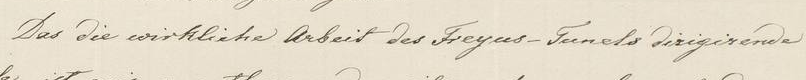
Das die wirkliche Arbeit des Freyus -Tunels dirigirende
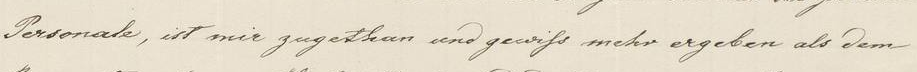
Personale, ist mir zugethan und gewiss mehr ergeben als dem
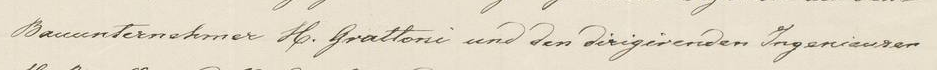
Bauunternehmer H. Grattoni und den dirigirenden Ingenieuren
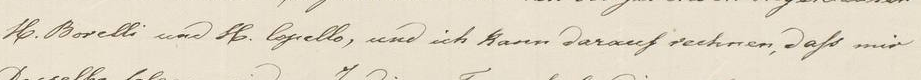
H. Borelli und H. Copello, und ich kann darauf rechnen, dass mir
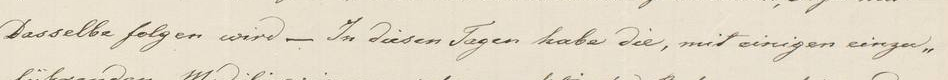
Dasselbe folgen wird – In diesen Tagen habe die, mit einigen einzu-
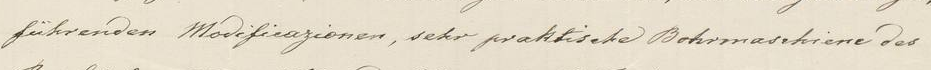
führenden Modificazionen, sehr praktische Bohrmaschiene des
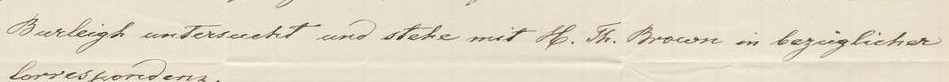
Burleigh untersucht und stehe mit H. Th. Brown in bezüglicher
